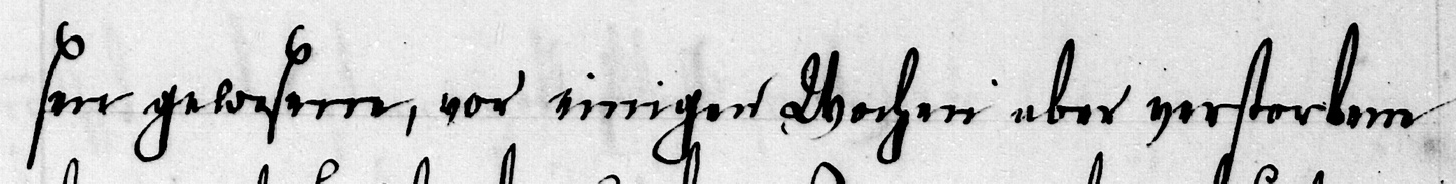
sen gewesene, vor einigen Wochen aber verstorbene
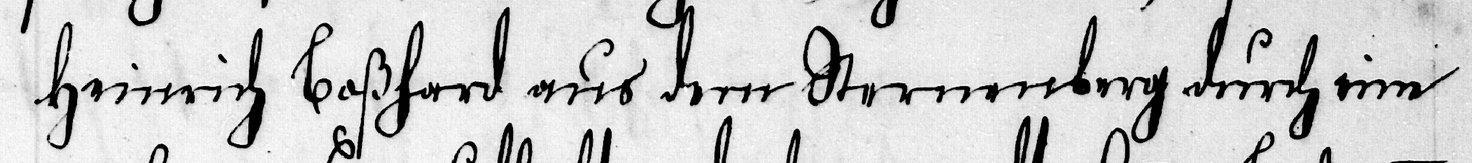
Heinrich Boßhard aus dem Sternenberg durch eine
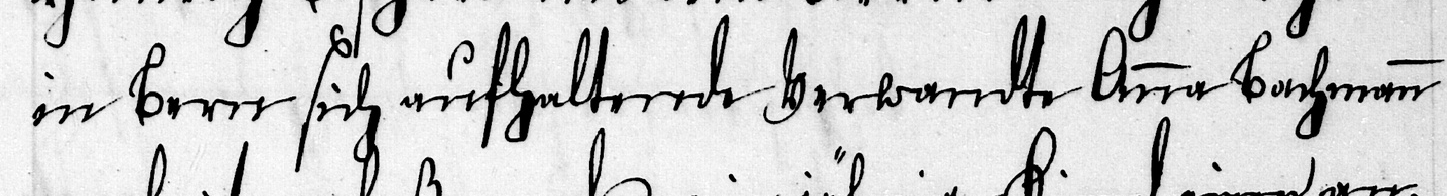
in Bern sich aufhaltende Verwandte Anna Bachmann
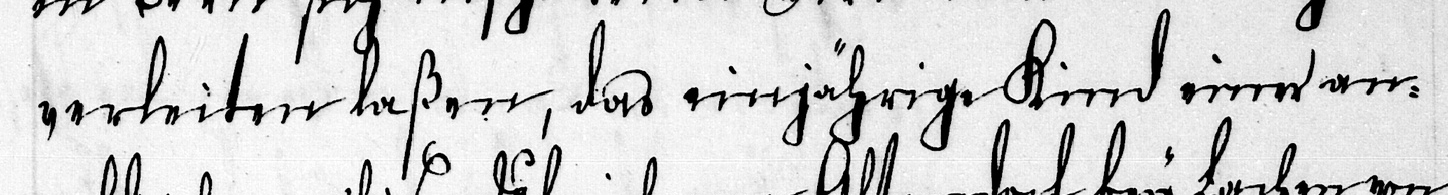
verleiten laßen, das einjährige Kind einer an¬
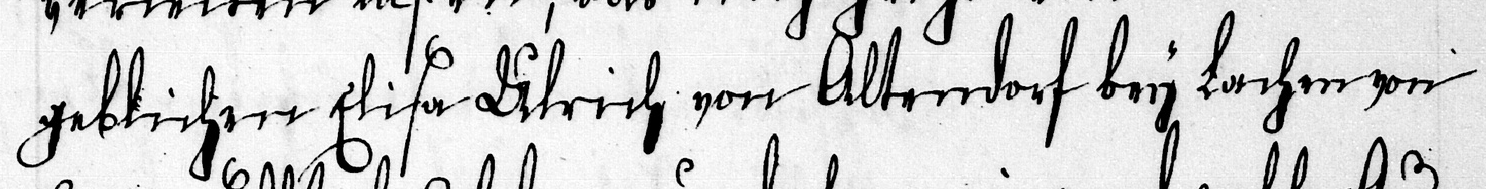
geblichen Elisa Ulrich von Altendorf bey Lachen von
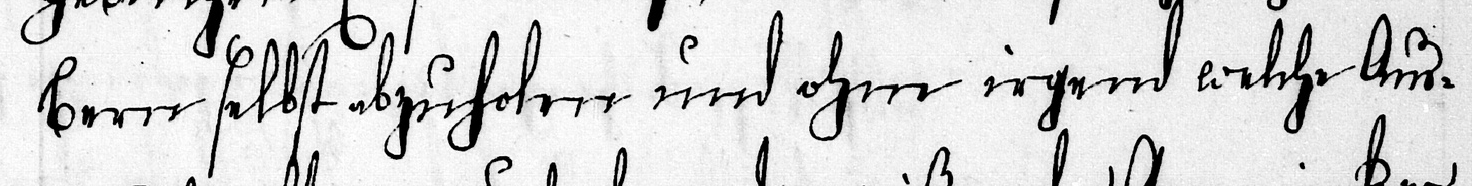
Bern selbst abzuholen und ohne irgend welche Aus¬
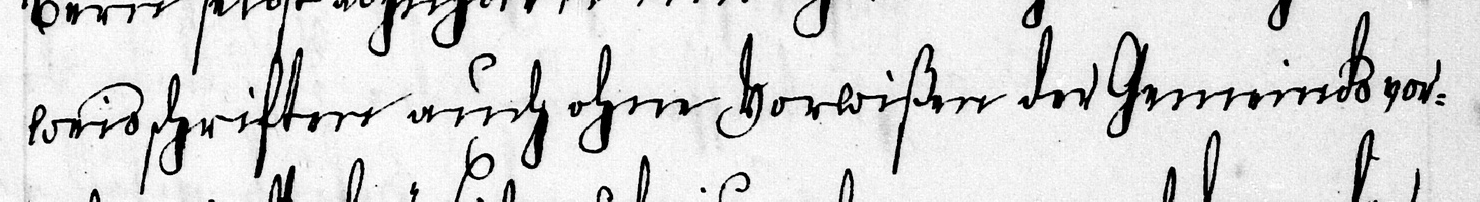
weisschriften auch ohne Vorwißen der Gemeindsvor¬
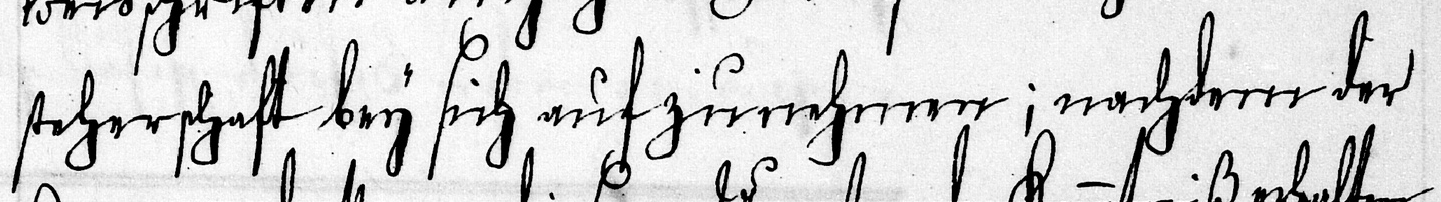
steherschaft bey sich aufzunehmen; nachdem der
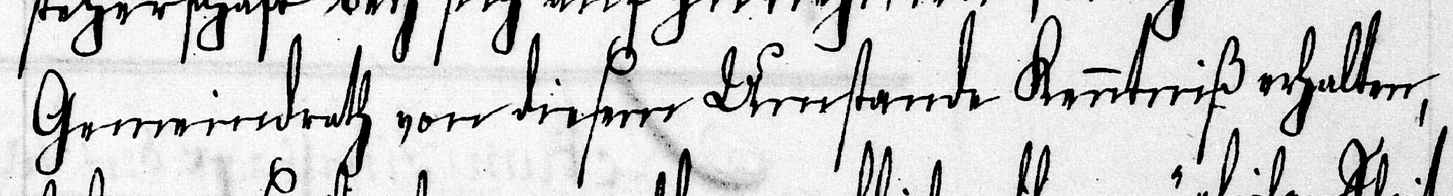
Gemeindrath von diesem Umstande Kenntniß erhalten,
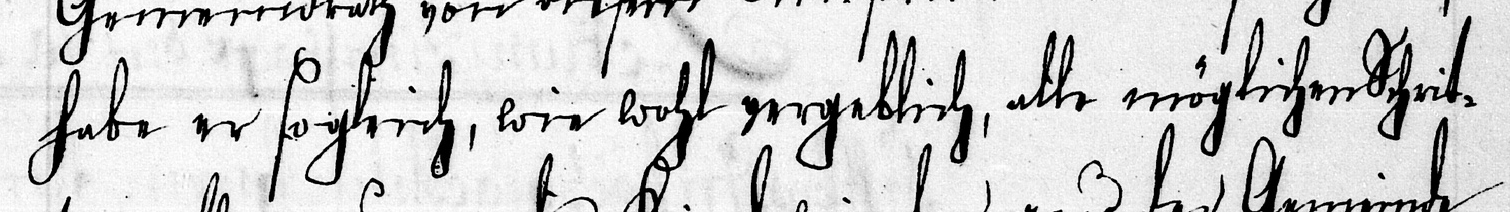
habe er sogleich, wie wohl vergeblich, alle möglichen Schri¬
